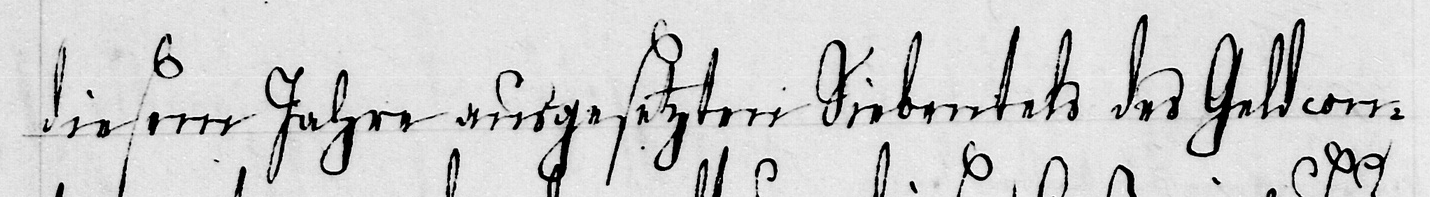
diesem Jahre ausgesetzten Siebentels des Geldcon¬
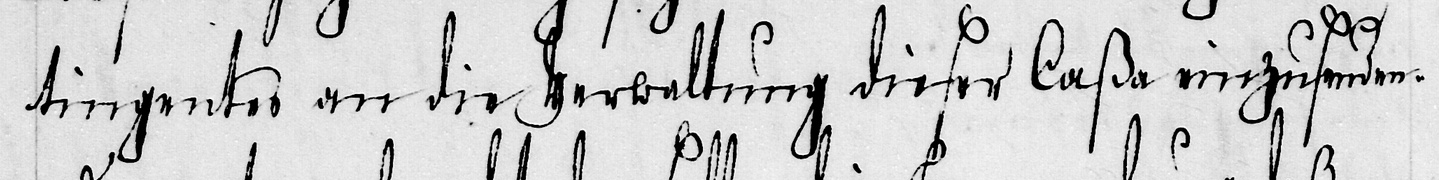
tingentes an die Verwaltung dieser Caßa einzusenden.
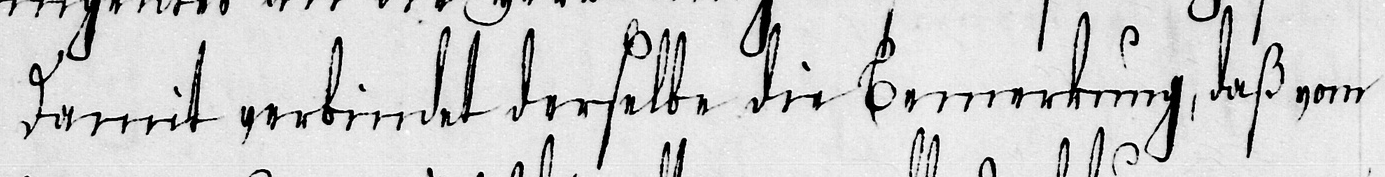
Damit verbindet derselbe die Bemerkung, daß vom
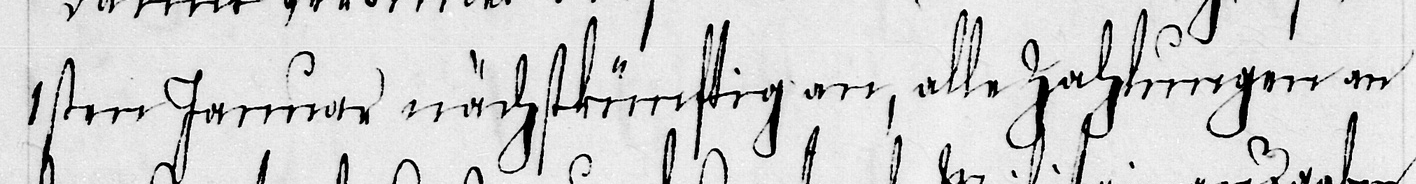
1sten Januar nächstkünftig an, alle Zahlungen an
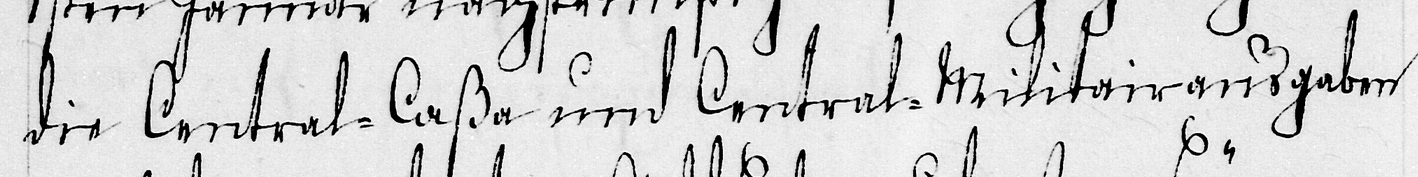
die Central-Caßa und Central-Militairausgaben
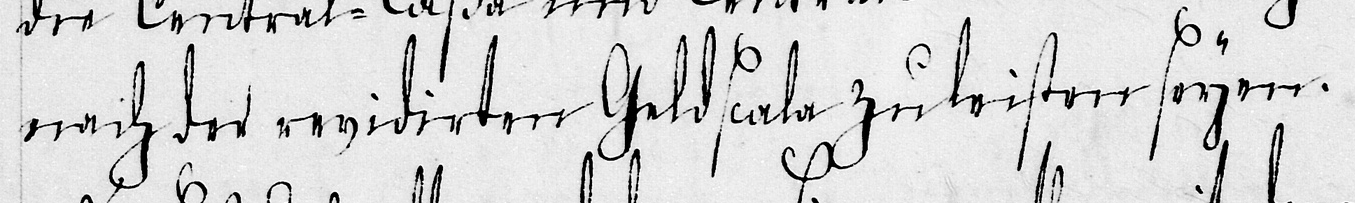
nach der revidirten Geldscala zu leisten seyen.
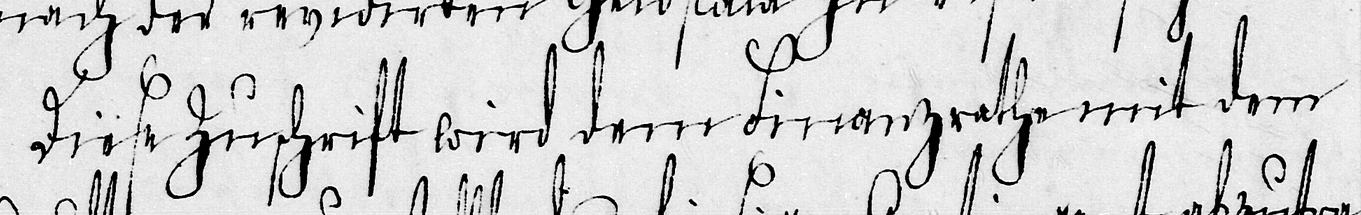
Diese Zuschrift wird dem Finanzrathe mit dem
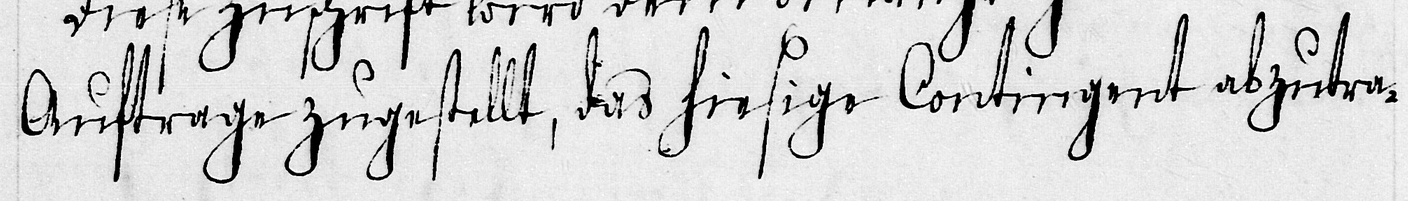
Auftrage zugestellt, das hiesige Contingent abzutra¬
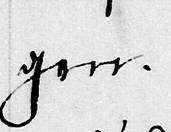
gen.
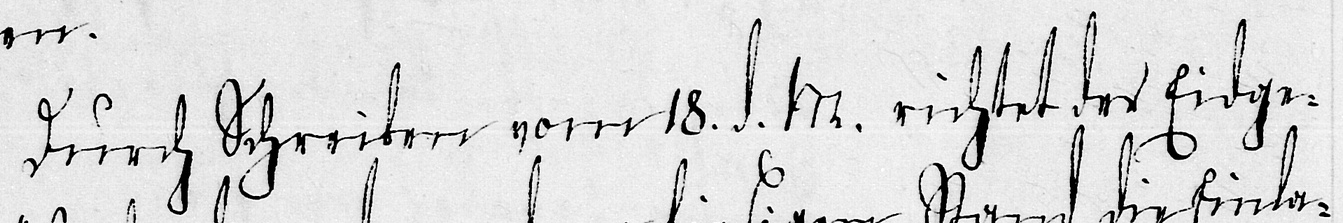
Durch Schreiben vom 18. d. M. richtet der Eidge¬
